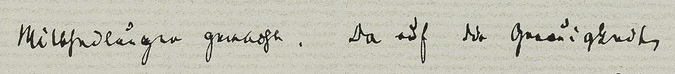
Mittheilungen gemacht. Da auf die Genauigkeit
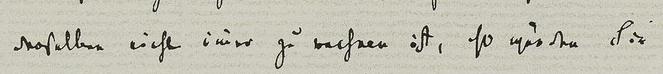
derselben nicht immer zu rechnen ist, so würden Sie
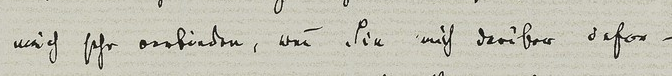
mich sehr verbinden, wenn Sie mich darüber infor-
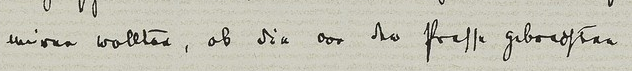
miren wollten, ob die von der Presse gebrachten
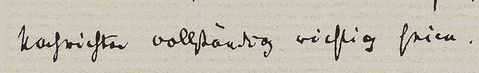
Nachrichten vollständig wichtig seien.
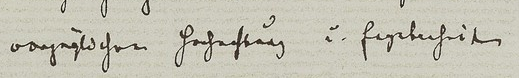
vorzüglichen Hochachtung u. Ergebenheit
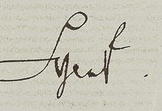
Schenk.
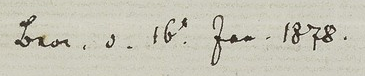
Bern, d. 16t Jan. 1878.
